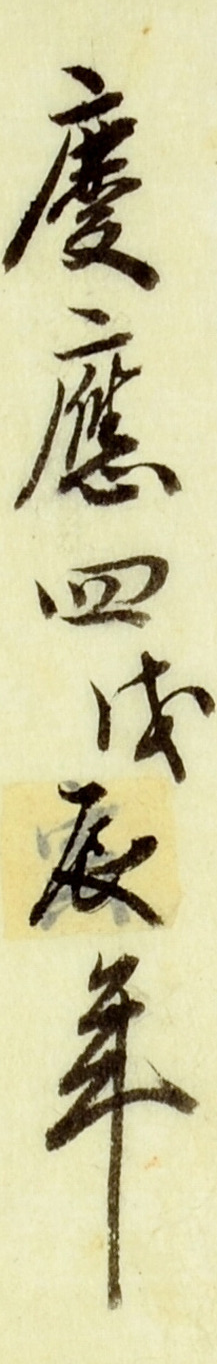慶應四戊辰年
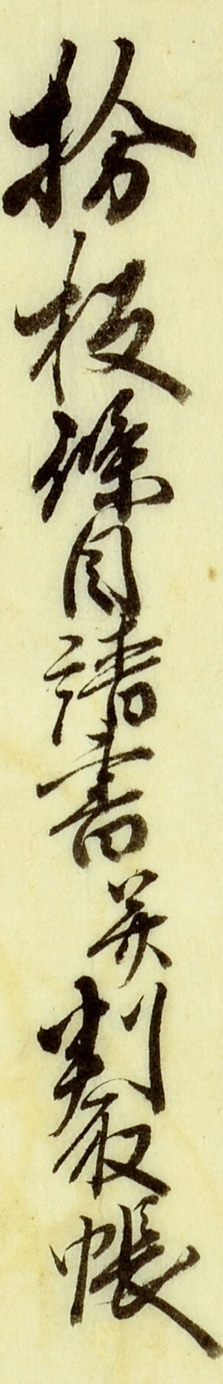枌板條目請書并判取帳
